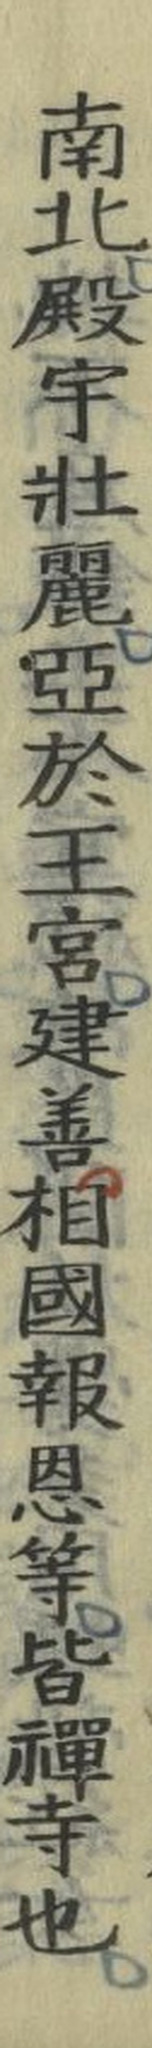南北。殿宇壯麗。亞於王宮。建善相國報恩等。皆禪寺也。
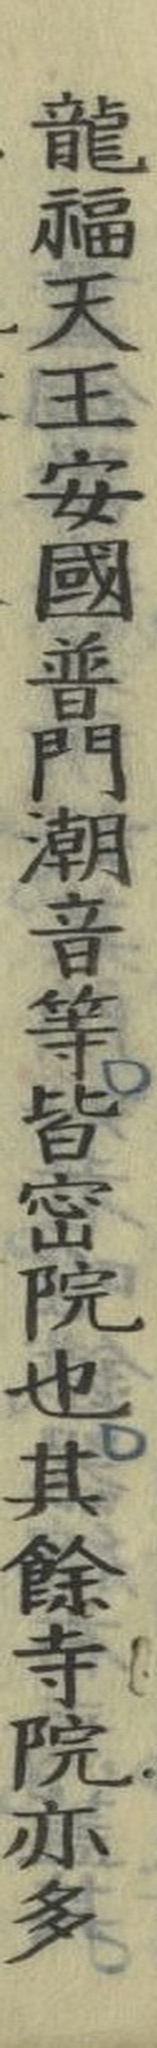龍福天王安國普門潮音等。皆密院也。其餘寺院亦多。
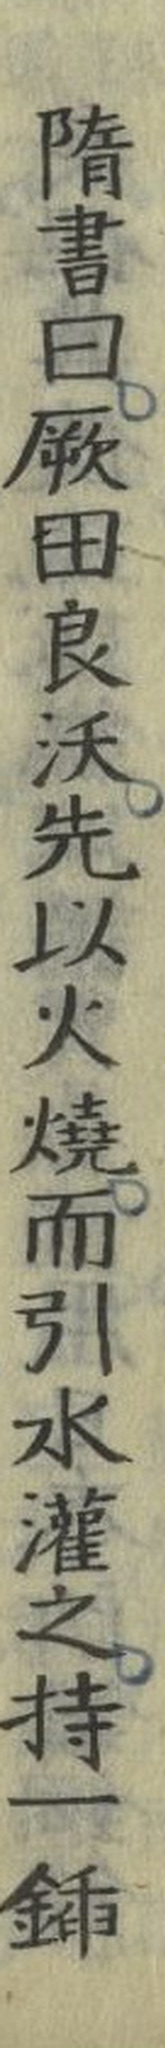隋書曰。厥田良沃。先以火燒。而引水灌之。持一鍤
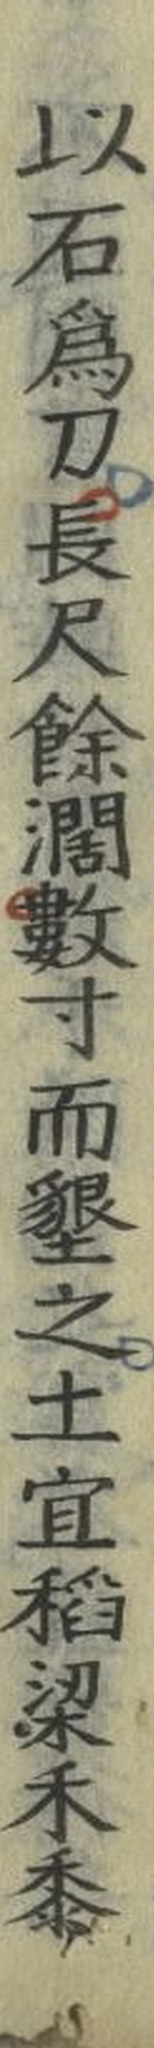以石爲刀。長尺餘濶數寸而墾之。土宜稻梁禾黍
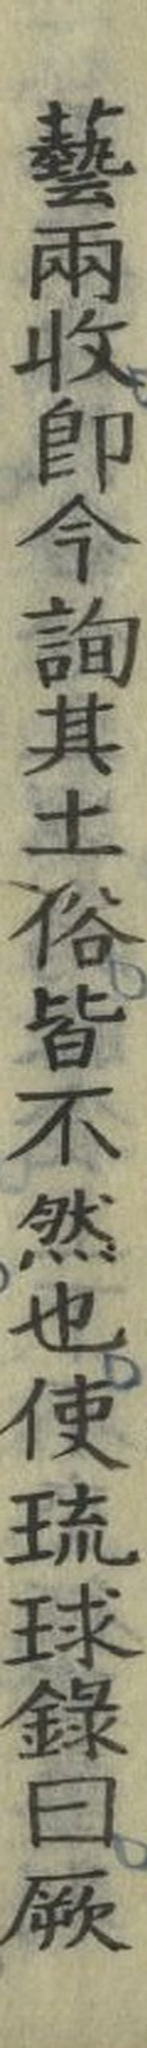藝兩收。卽今詢其土俗。皆不然也。使琉球錄曰。厥
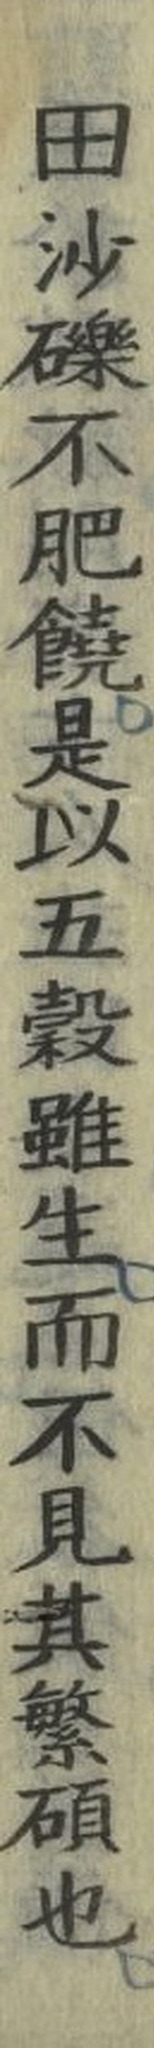田沙礫不肥饒。是以五穀雖生。而不見其穀繁碩也。

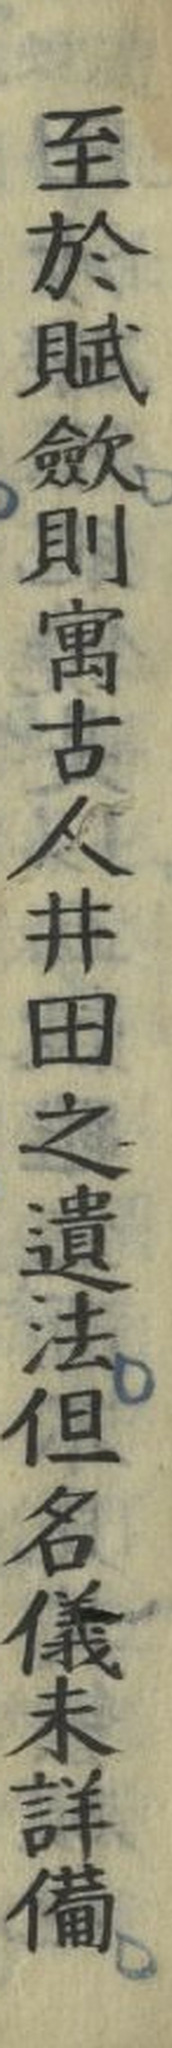至於賦歛。則寓古人井田之遺法。但名儀未詳僃。
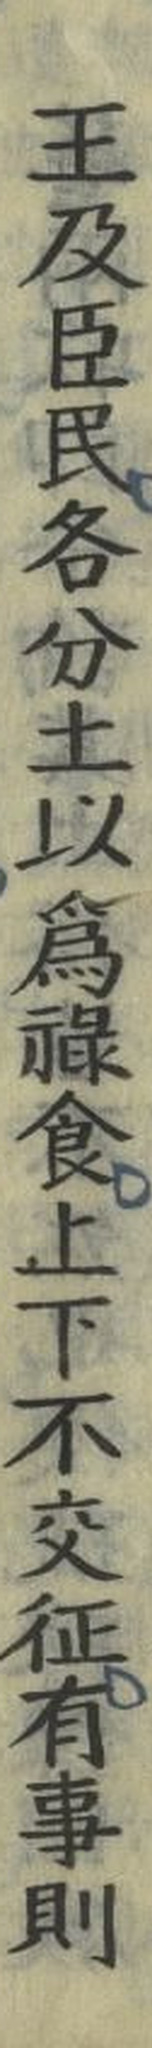王及臣民。各分土以爲祿食。上下不交征。有事則
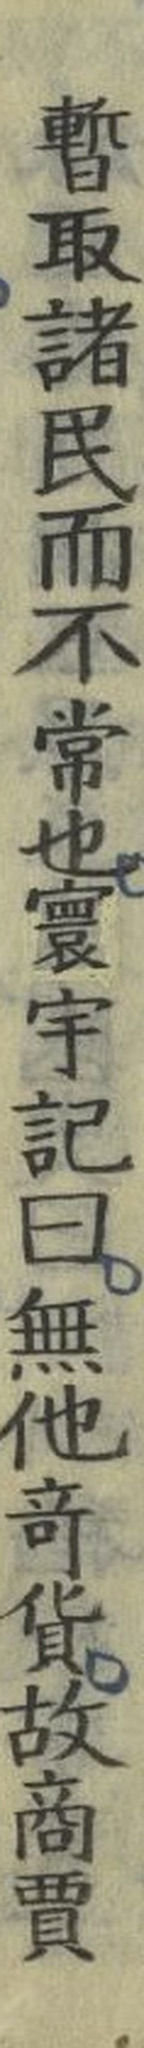暫取諸民而不常也。寰宇記曰。無他竒貨。故商賈
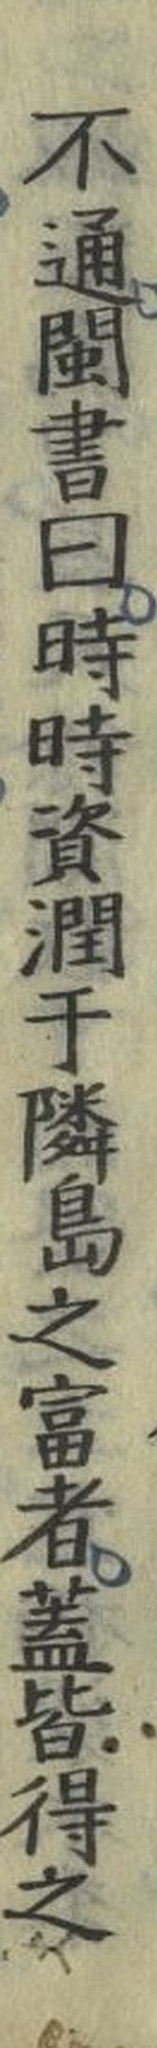不通。閩書曰。時時資潤于隣島之富者。蓋皆得之
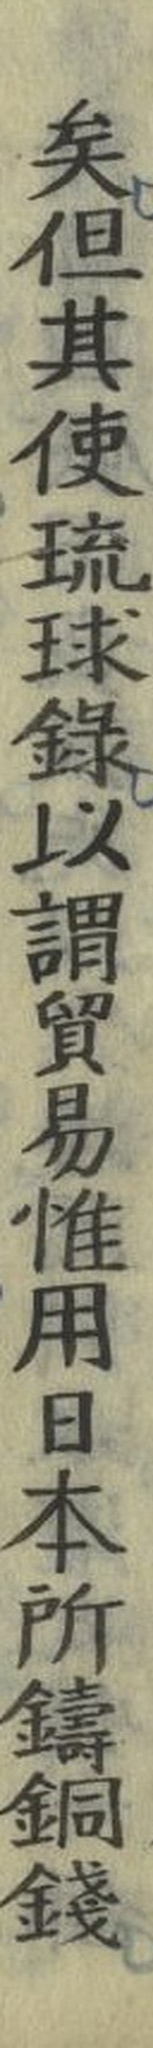矣。但其使琉球錄。以謂貿易惟用日本所鑄銅錢。
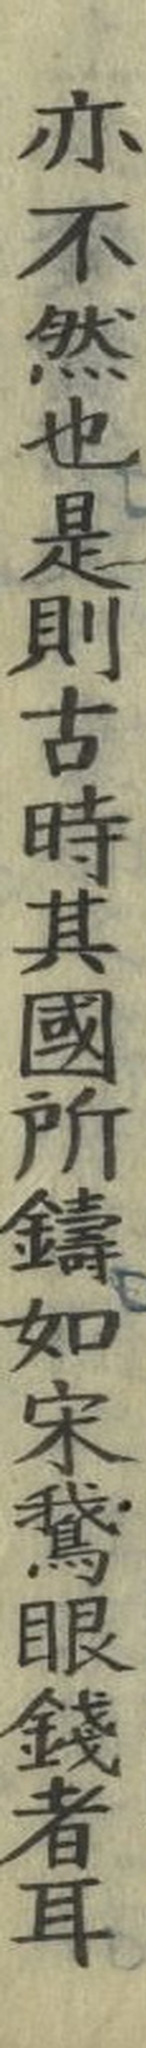亦不然也。是則古時其國所鑄。如宋鵞眼錢者耳。
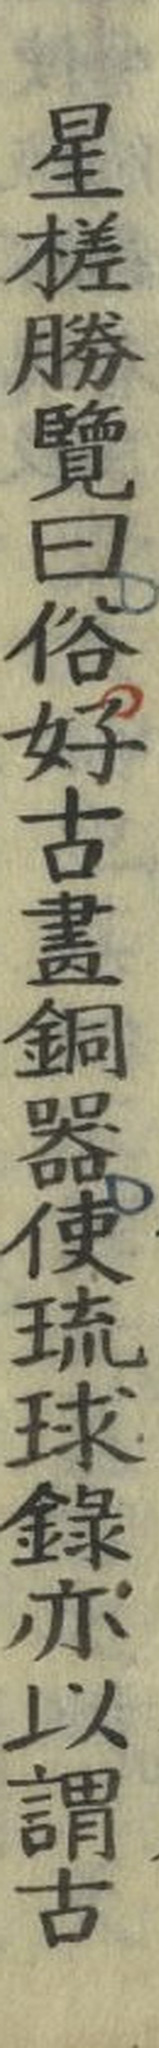星槎勝覽曰。俗好古畫銅器。使琉球錄亦以謂古
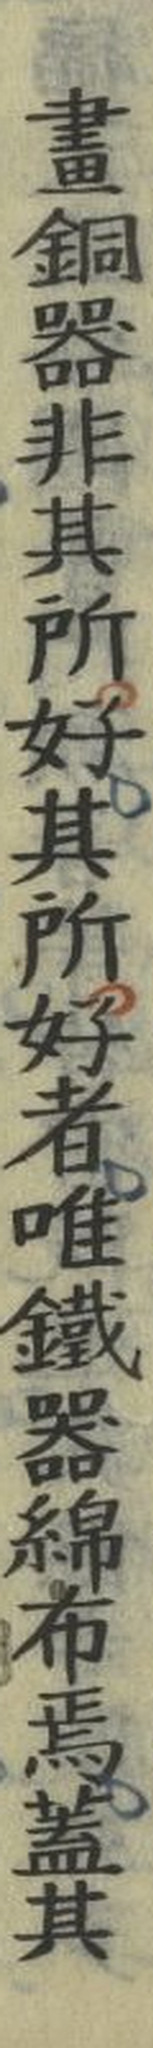畫銅器非其所好。其所好者。唯鐵器綿布焉。蓋其
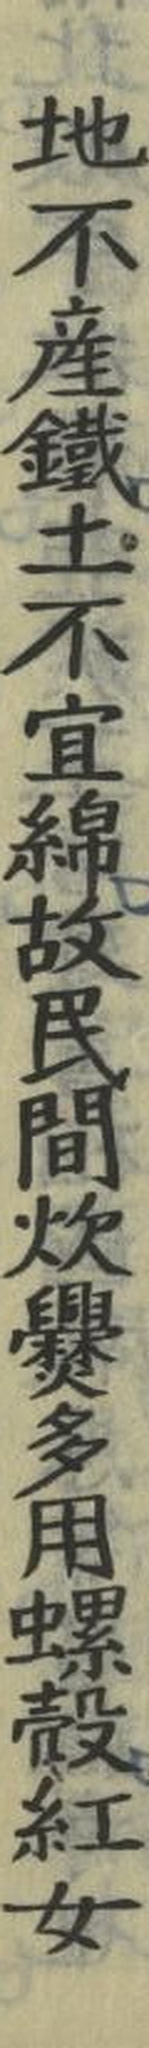地不産鐵。土不宜綿。故民間炊爨多用螺殻。紅女
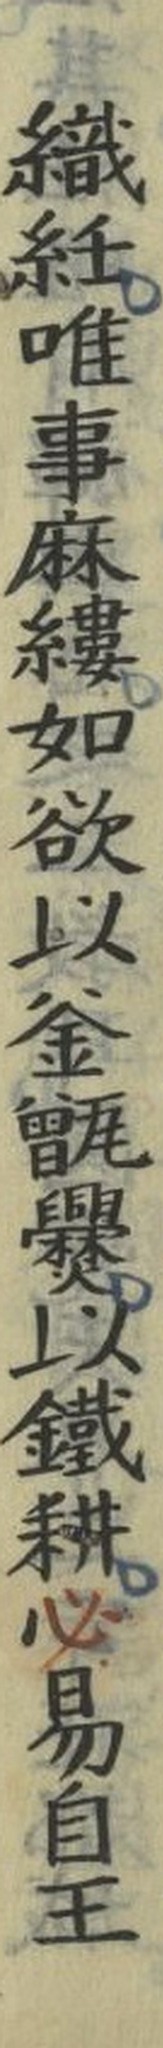織紝。唯事麻縷。如欲以釜甑爨。以鐵耕。必易自王
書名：南島志
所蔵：University of the Ryukyus Library
